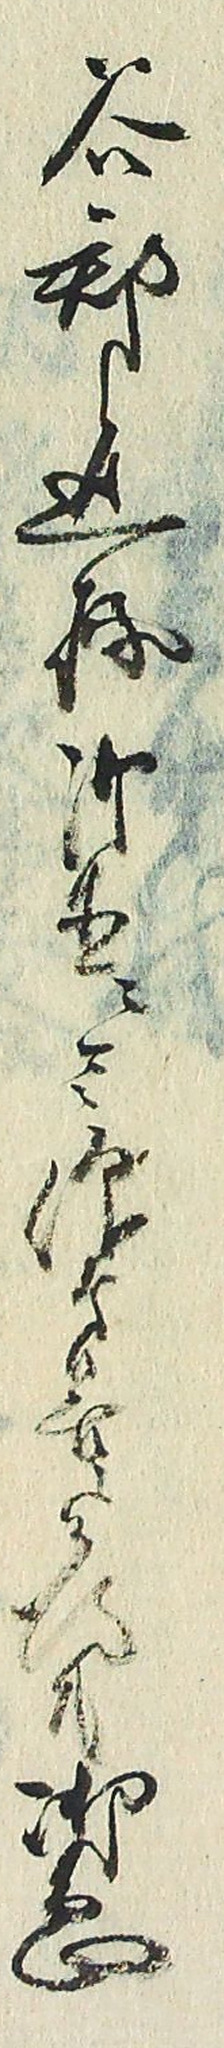谷邦之進様御直ニ可被仰付候筈ニ候得共御急
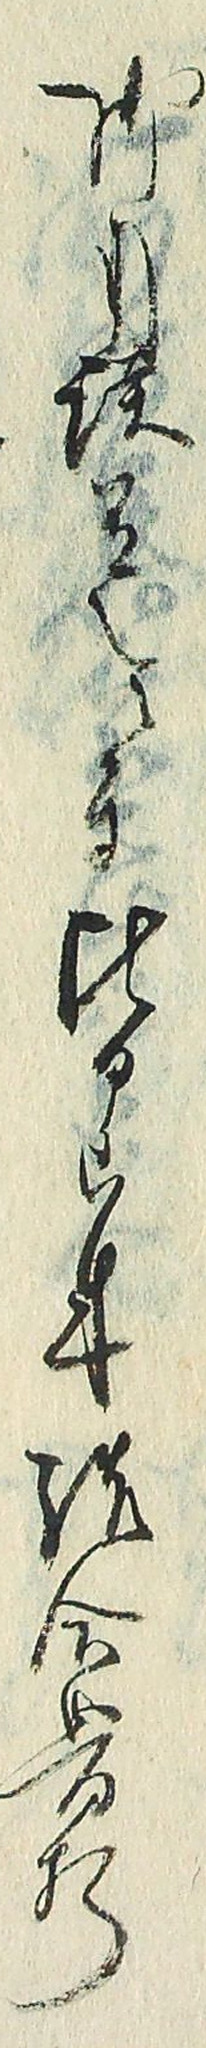御引請有之ニ付比日巳来詰合骨折
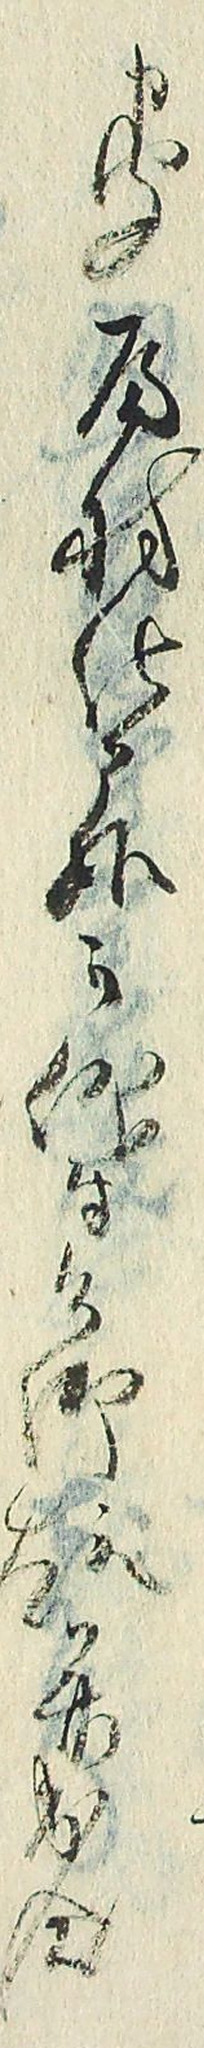申聞帰村仕申様被仰付候御趣弁出合
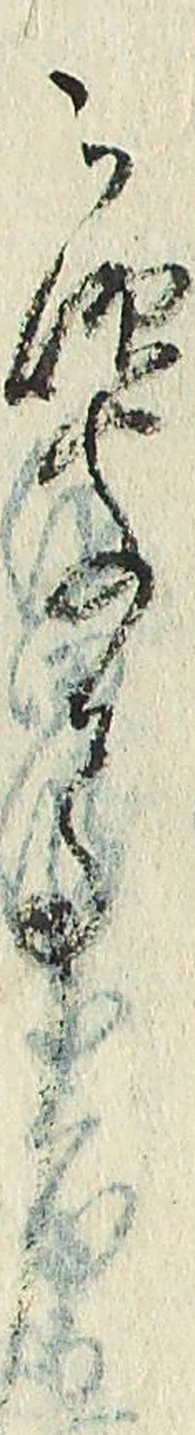被仰聞候事
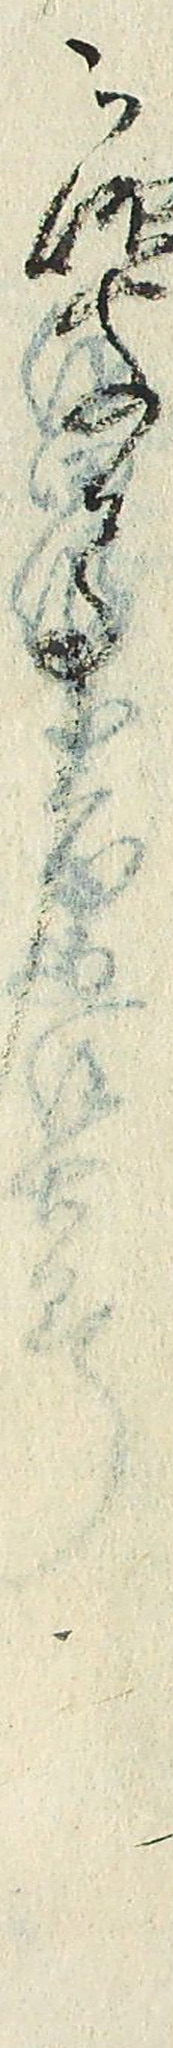被仰聞候事

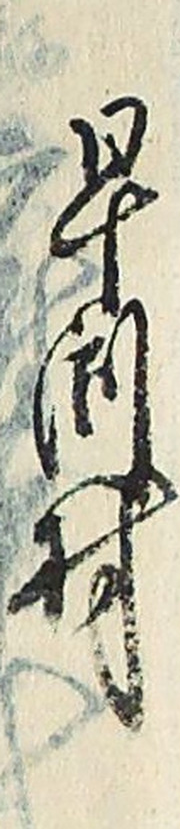早渕村
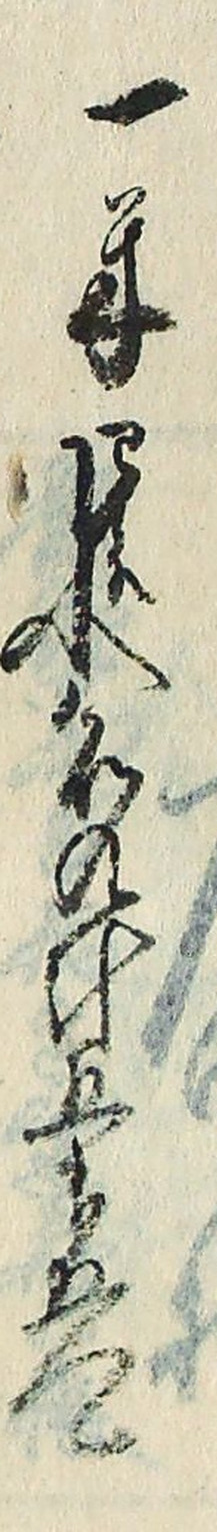一米四拾八石九斗五升五合
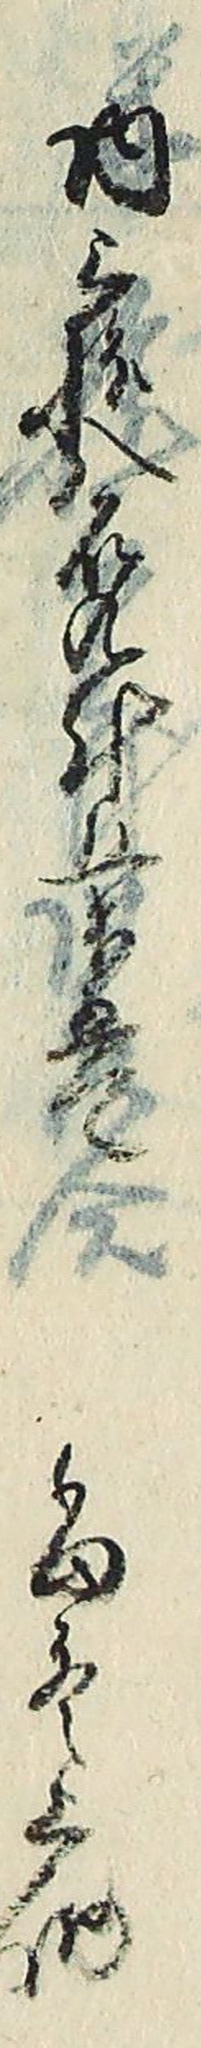内三拾八石九斗五升五合當冬上納
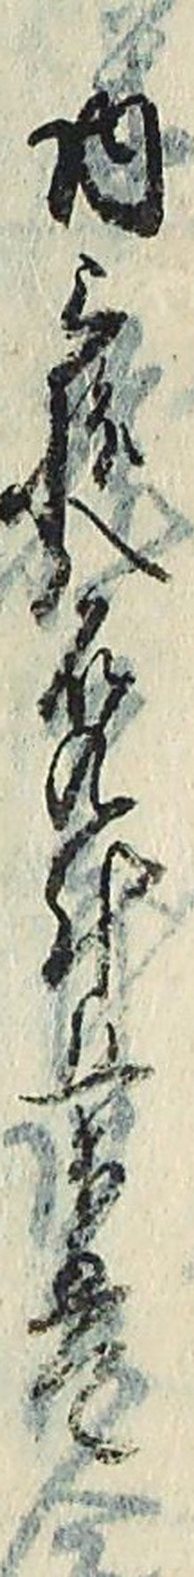一米四拾八石九斗五升五合
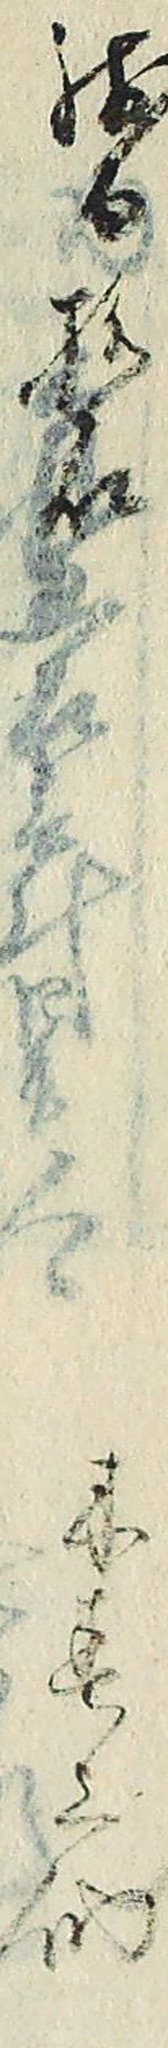残而拾石来春上納
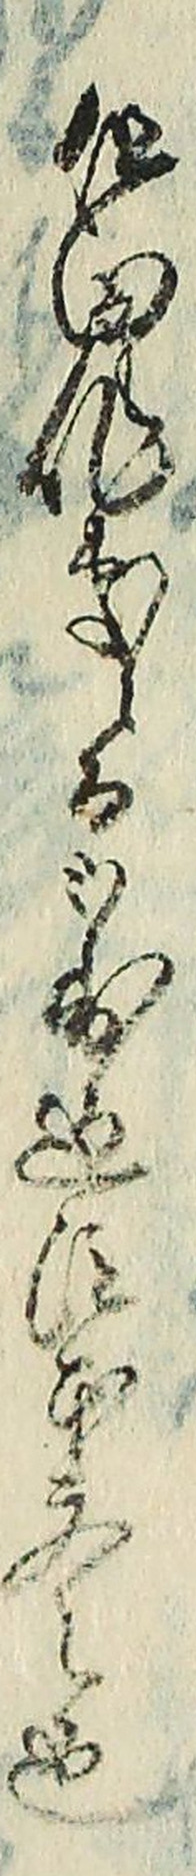但田作處ニ而弐歩通位本文之通
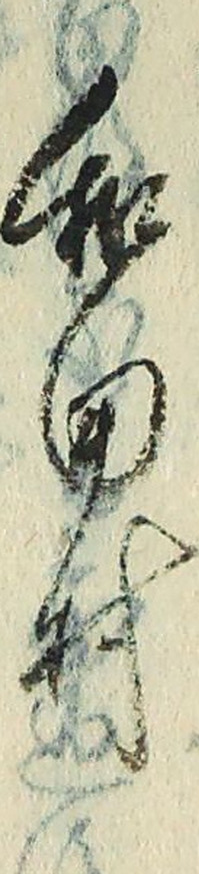和田村
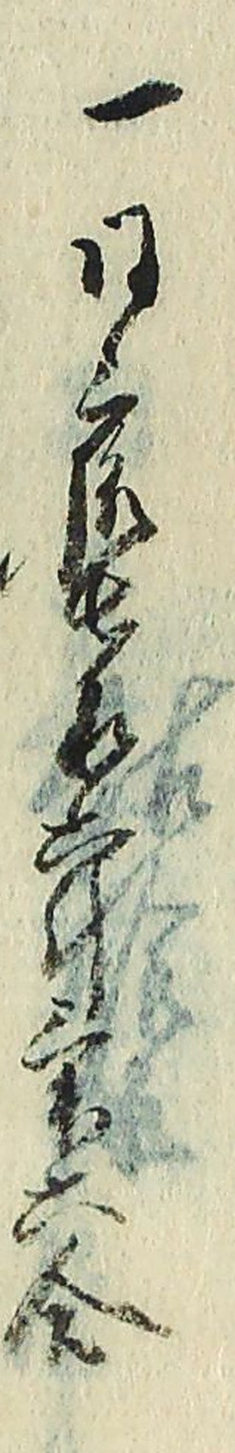一同三拾七石六斗三升六合
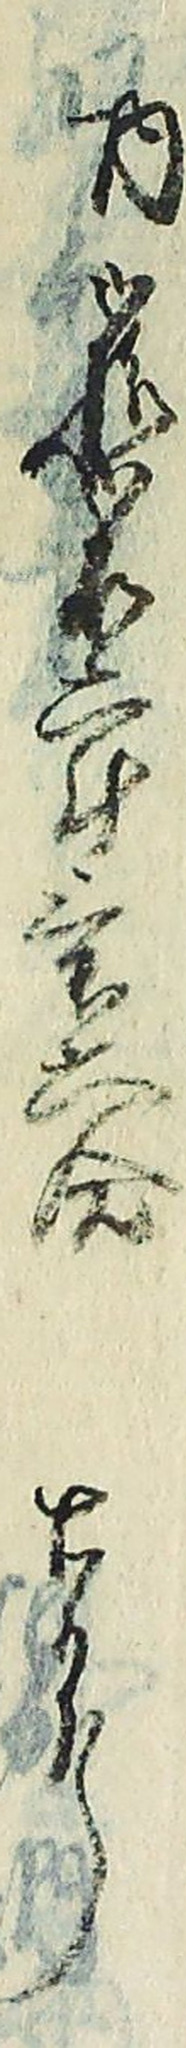内弐拾弐石六斗三升六合右同断
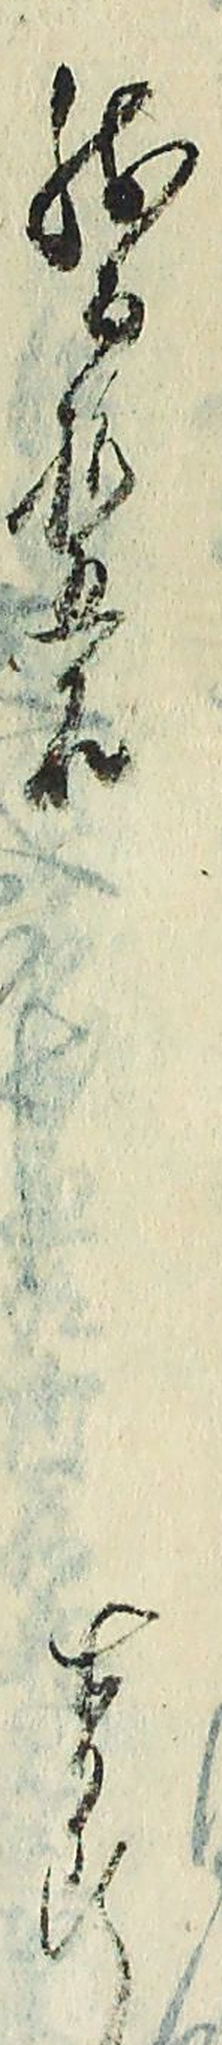残而拾五石右同断
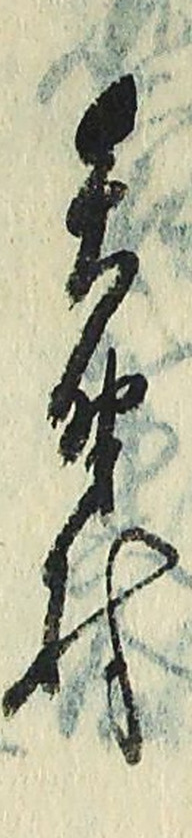矢野村
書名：諸御趣意書并御下知向之写
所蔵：鳴門教育大学 Naruto University of Education
